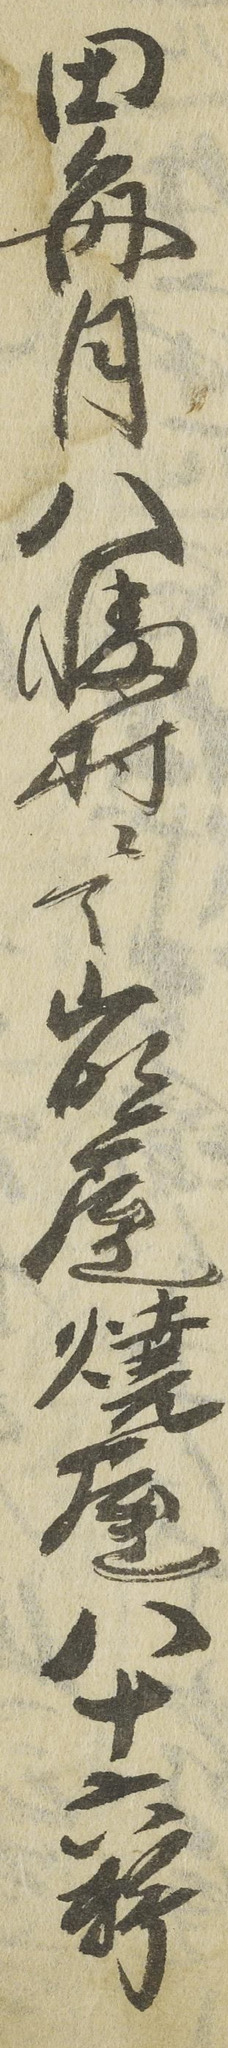田毎月八幡村ニて崩屋焼屋八十六軒
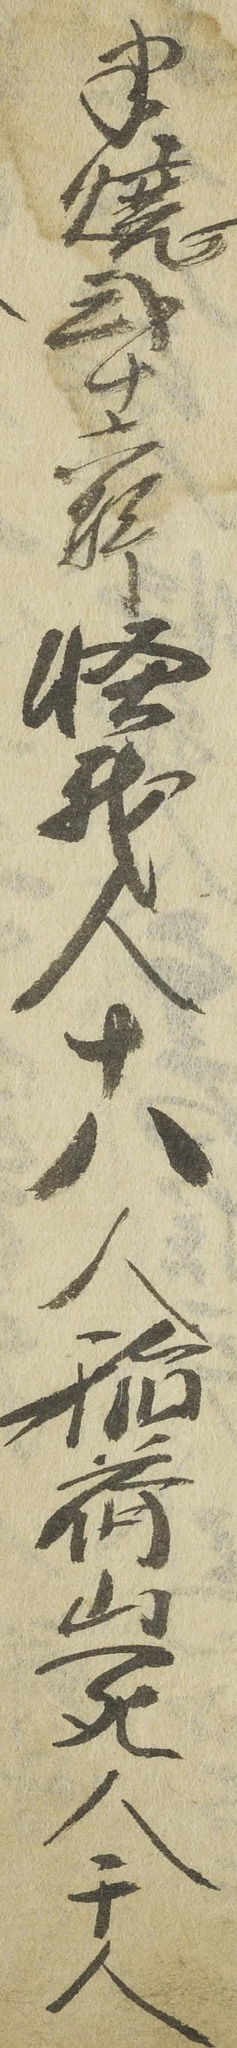半焼弐十六軒怪我人十八人稲荷山死人千人
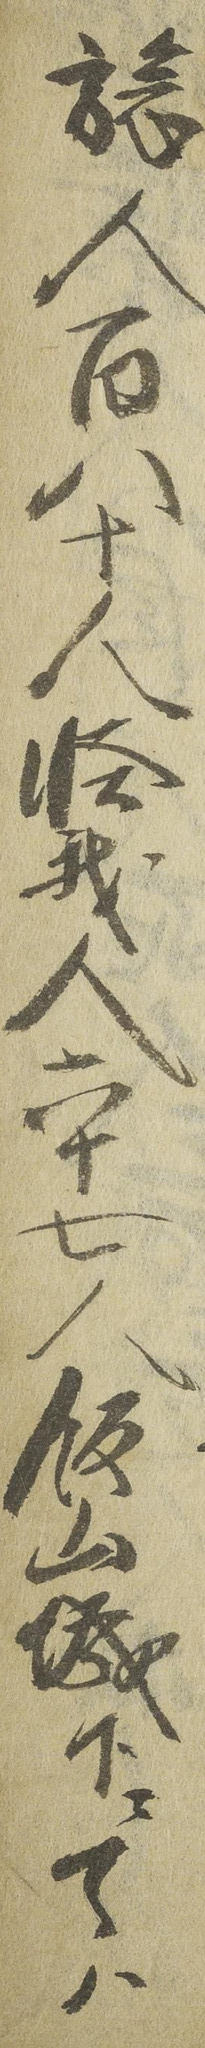旅人百八十人怪我人六十七人飯山城下ニてハ

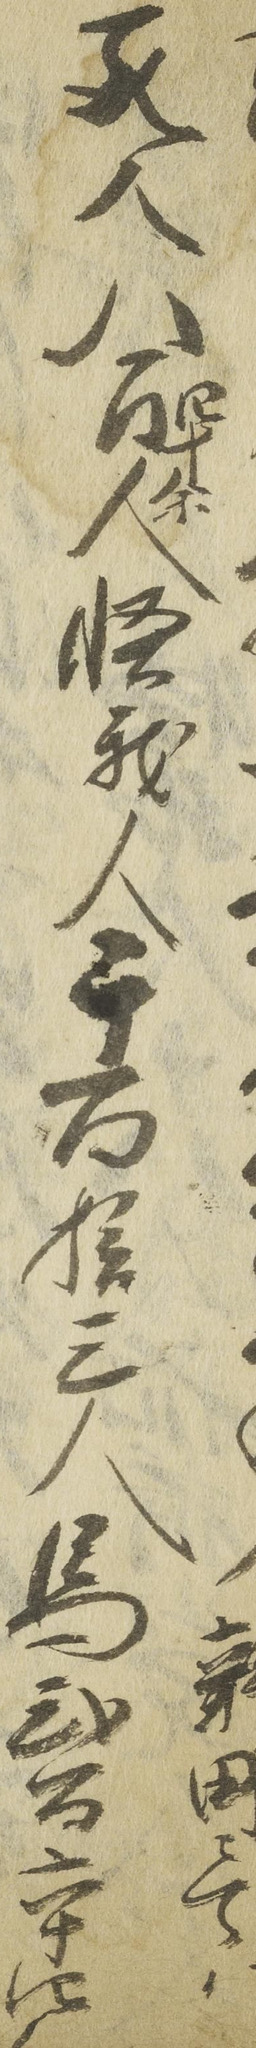死人八百四十余人怪我人千百拾三人馬弐百六十四
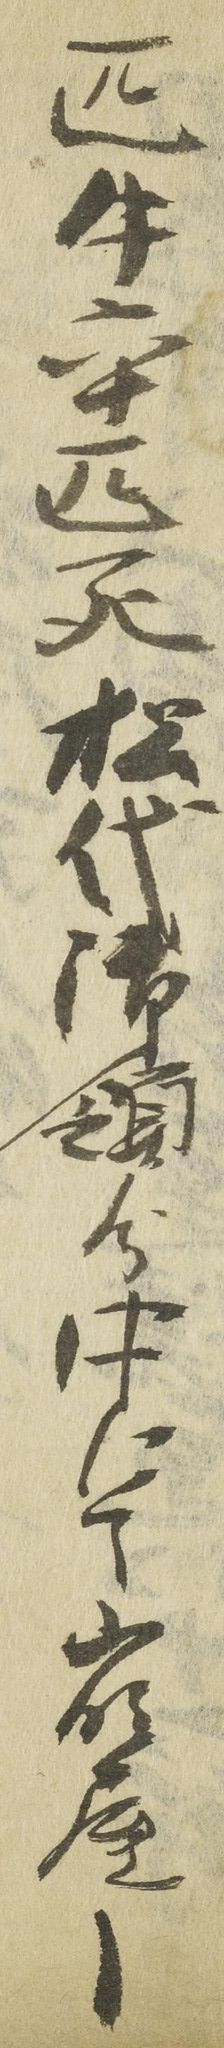匹牛六十匹死松代御領分中にて崩屋
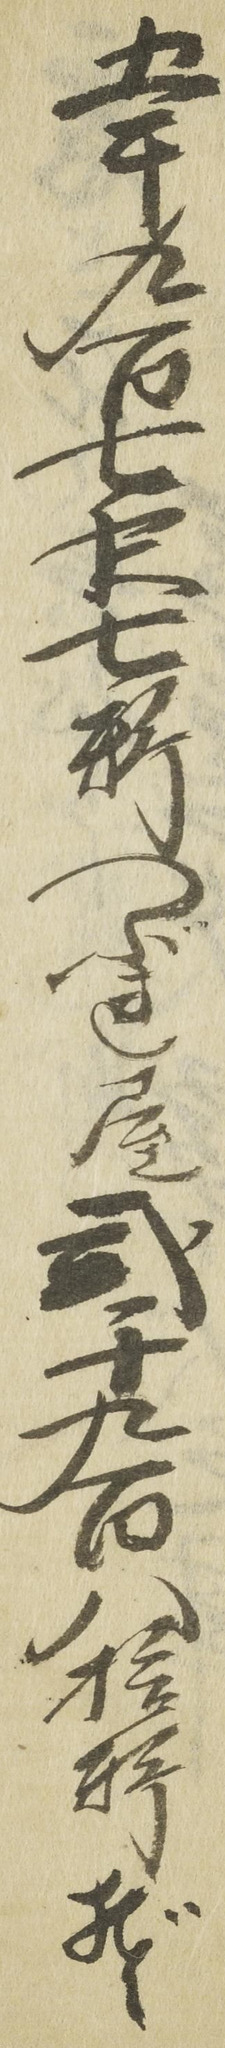五千九百七拾七軒つぶれ屋弐千九百八拾軒ぞ
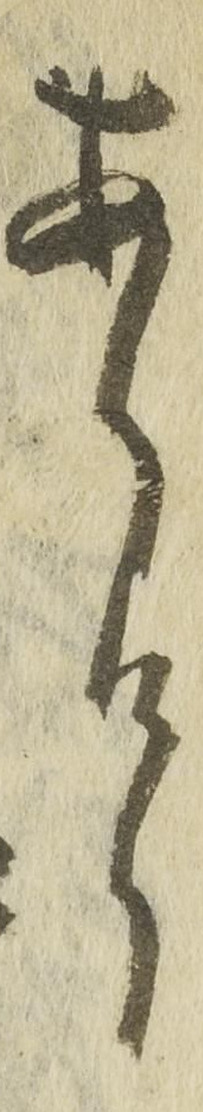ありけり
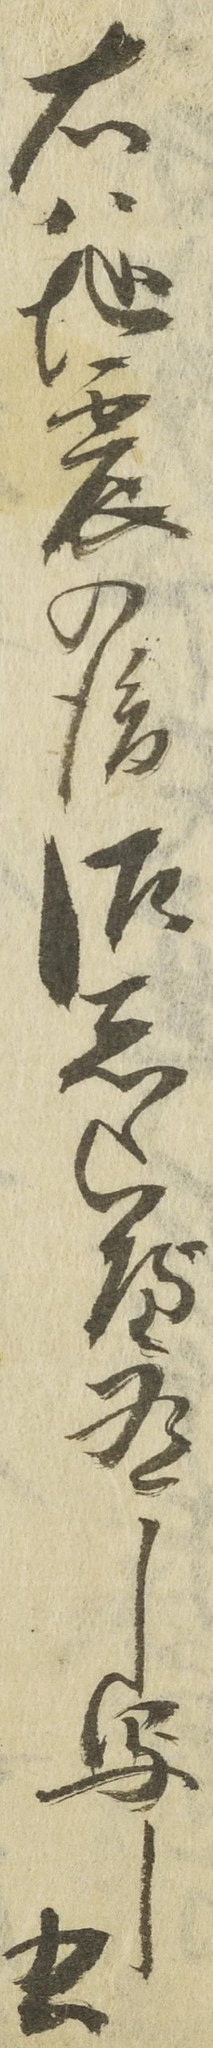右ハ地震の後御しらべ有し写し書
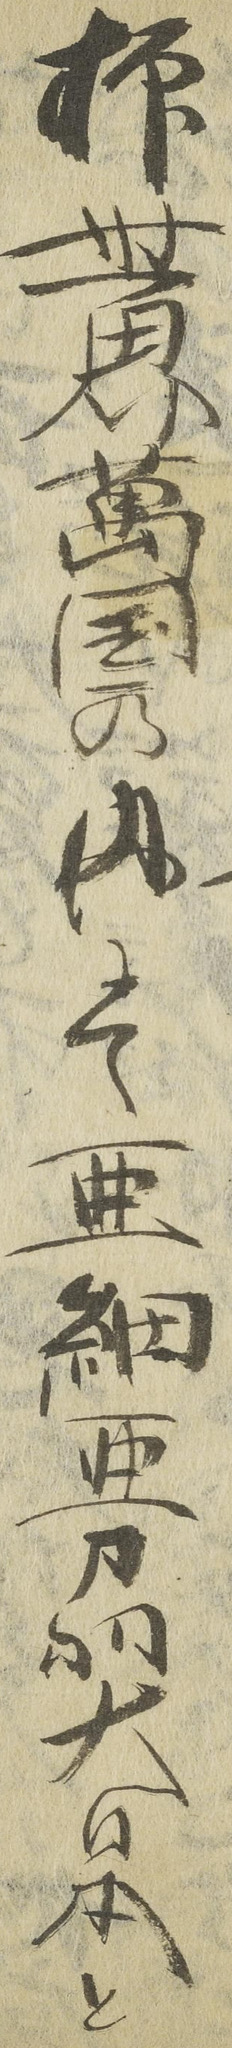抑世界万国の内にて亜細亜州大日本と
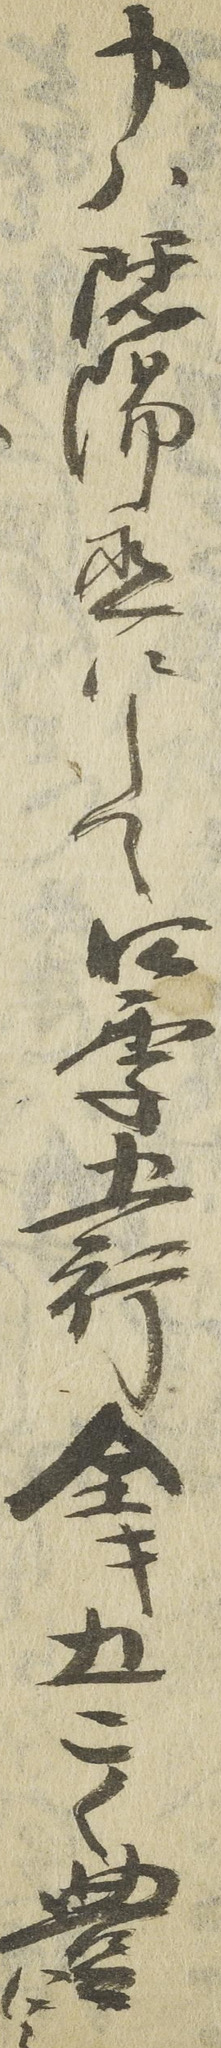申ハ陰陽動にして四季五行全キ五こく豊にし
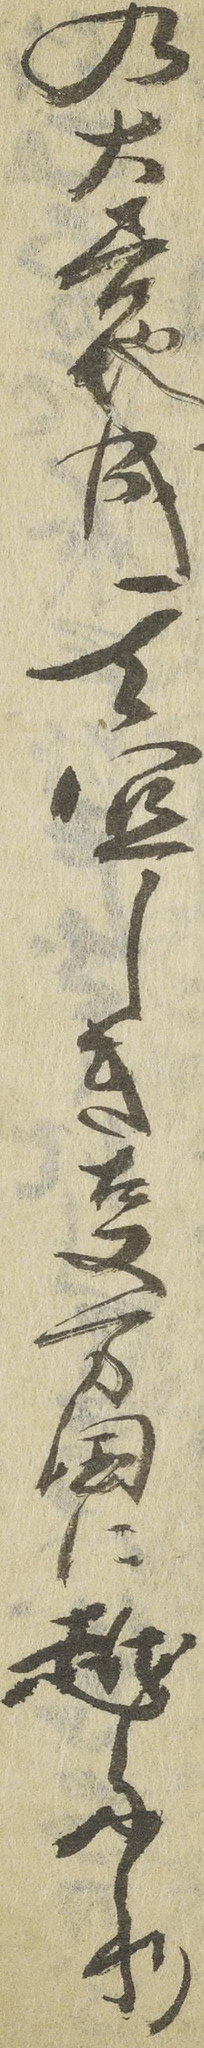乃大善地成其宜しき事万国に越たり
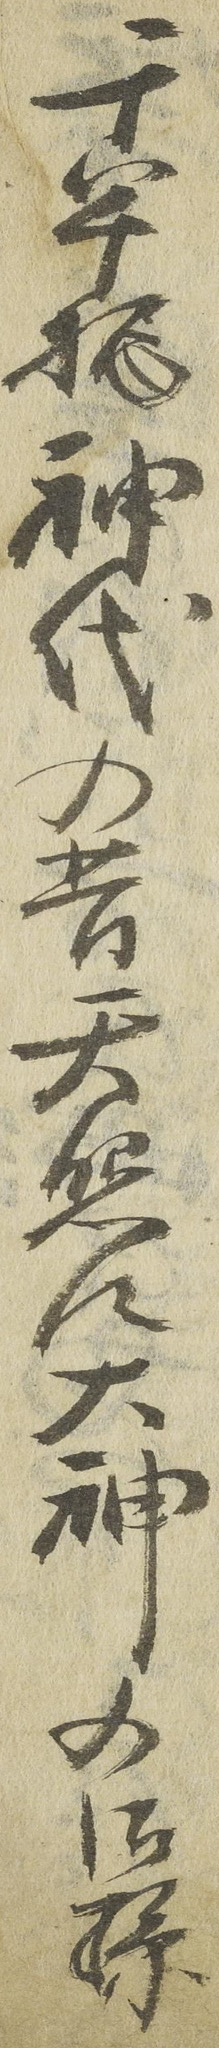千早振神代の昔天照す大神の御孫
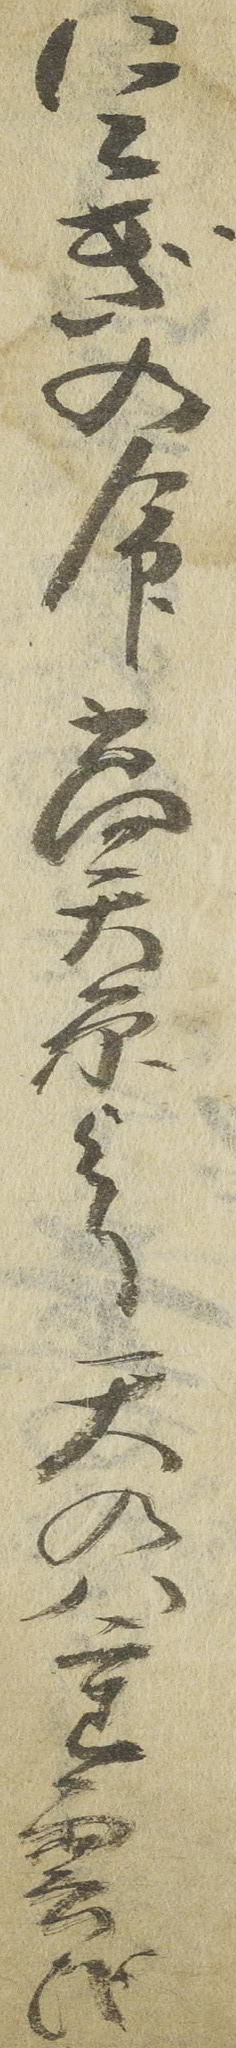にゝぎの命高天原より天の八重雲を
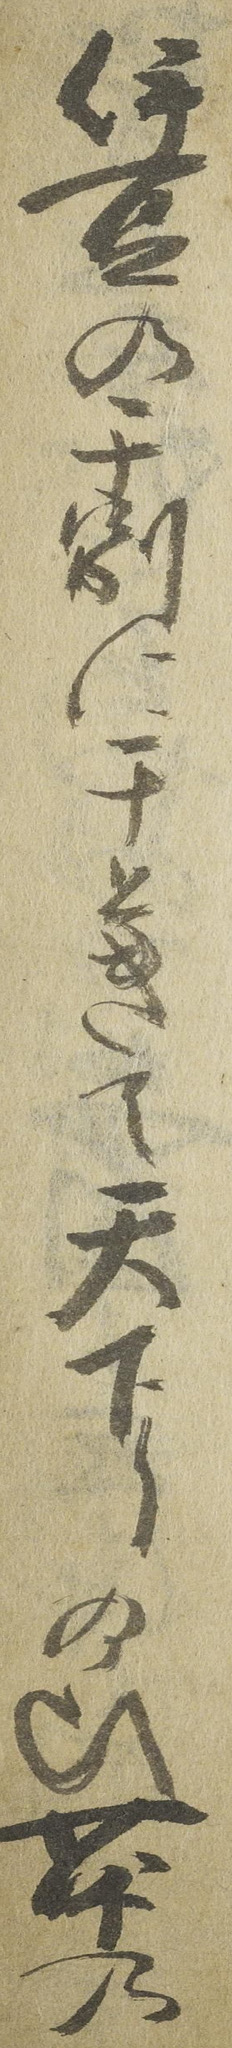伊豆の千別に干ときて天下り給ひ草の

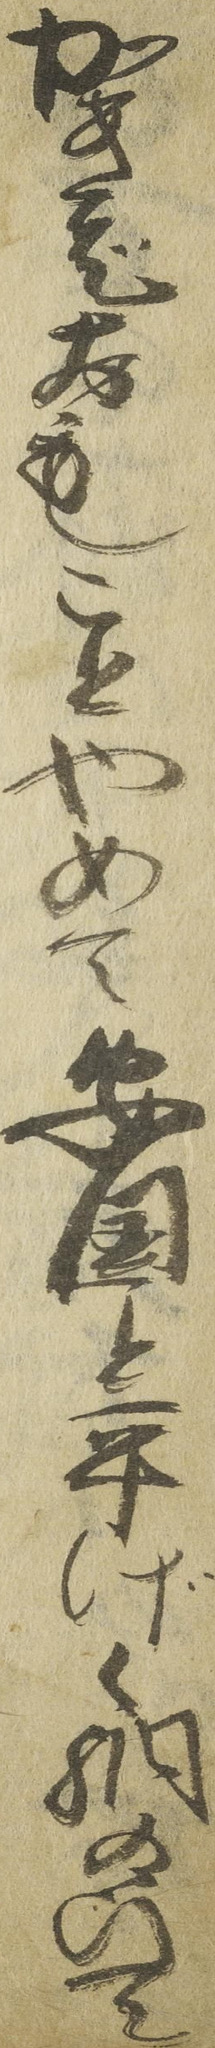かきばおもことやめて安国と平げて納め給ひて
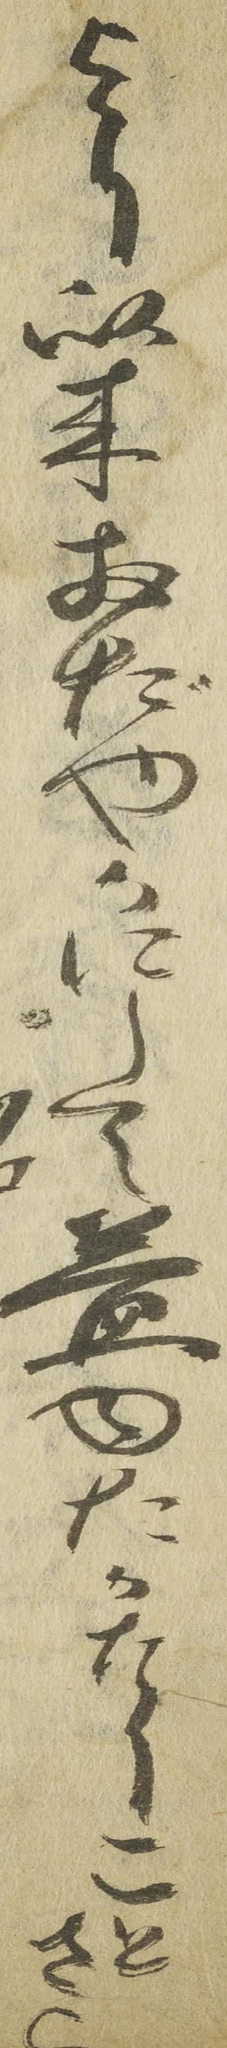より以来おだやかにして益ゆたかなりことさら
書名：善光寺地震聞書
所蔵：東京大学地震研究所図書室 Earthquake Research Institute Library, The University of Tokyo, JAPAN
